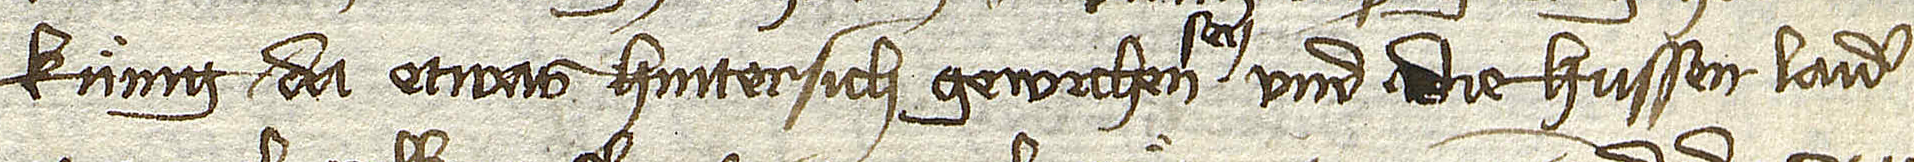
künig / da etwas hinter ſich gewichen vnd die huſſen laid*
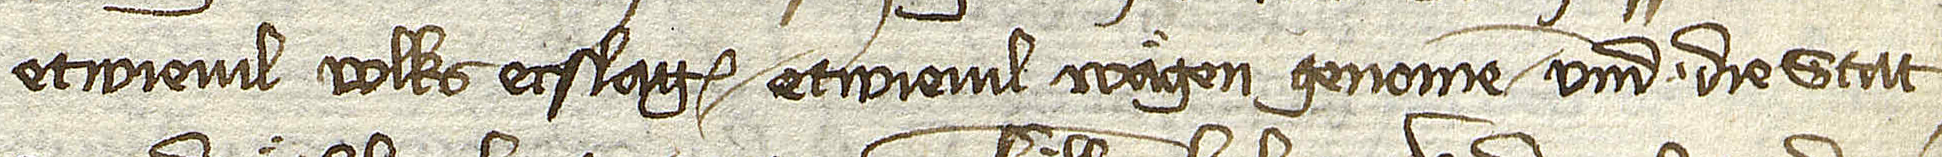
etwieuil volks erſlag* / etwieuil wägen genome* / vnd . die Stat
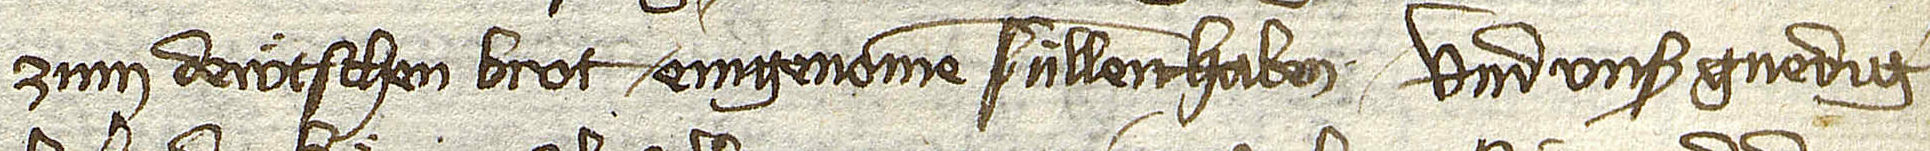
ʒum dewtſchen brot / eingenome* ſüllen haben . / Vnd vnſ* gnedig*
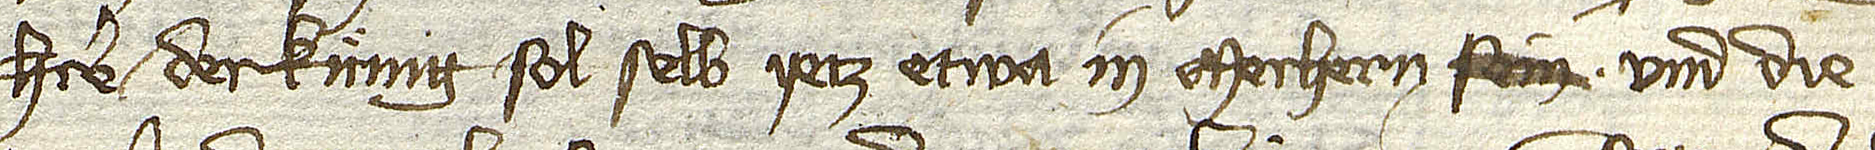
H*re / der künig / ſol ſelb yecʒ etwa in Merhern ſein . vnd die
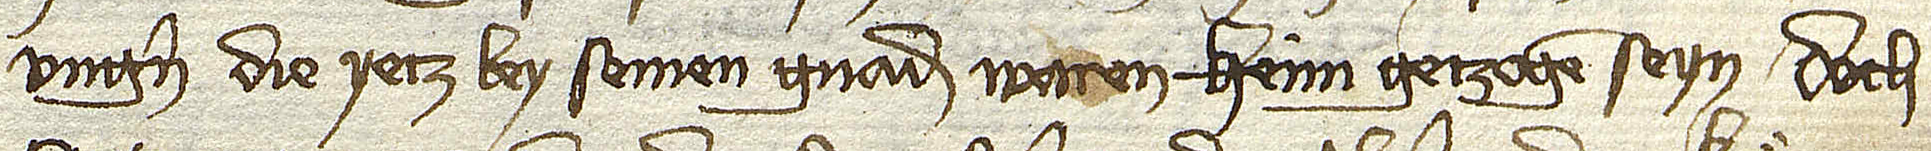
vng*n die yecʒ bey ſeinen gnad* waren heim gecʒoge* ſeyn / Doch
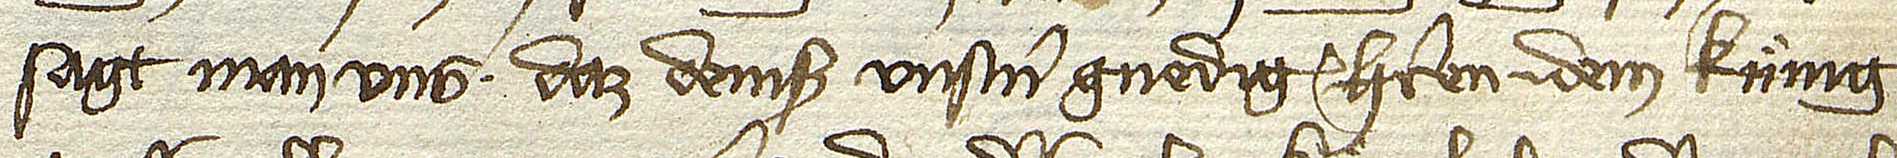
ſagt man vns . daʒ demſ* vnſ*m gnedig* h*ren ~ dem künig
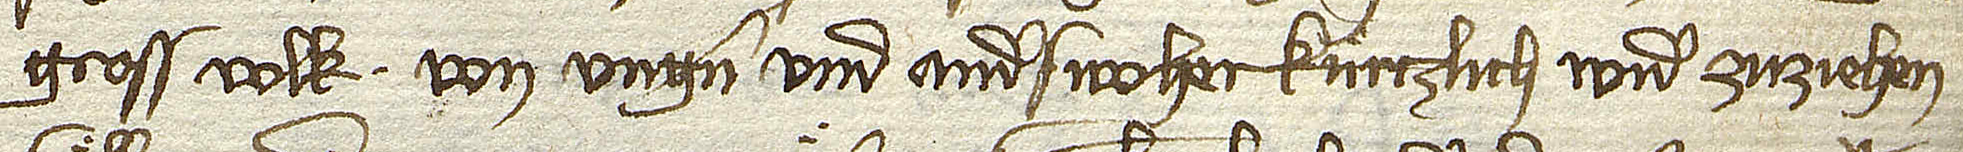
groſſ volk . von vng*n vnd and*ſwoher kürcʒlich wid* ʒuʒiehen
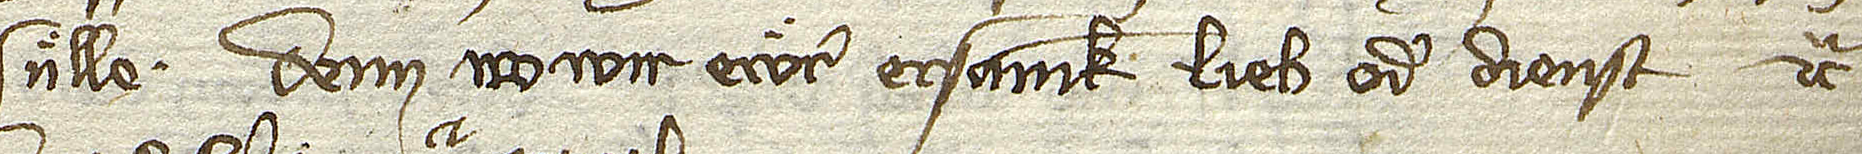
ſülle . Denn wo wir ew*r erſamk* lieb od* dienſt ec*
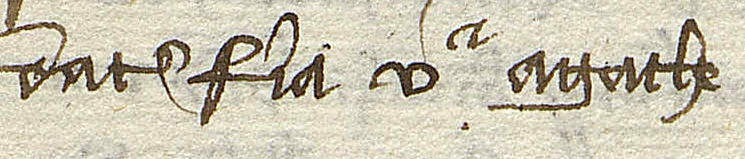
Dat* fia* v* agathe
